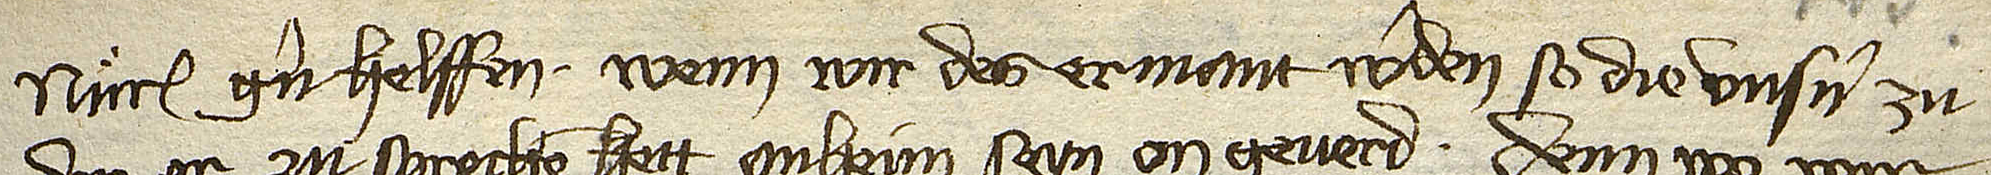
Nür* gn* helffen . wenn wir des ermant w*den ſo die vnſ*n ʒu
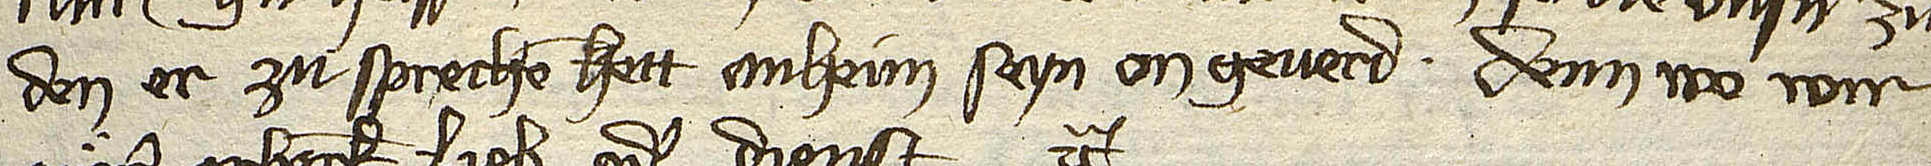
den er ʒu ſpreche* hett anheim ſeyn on geuerd . Denn wo wir
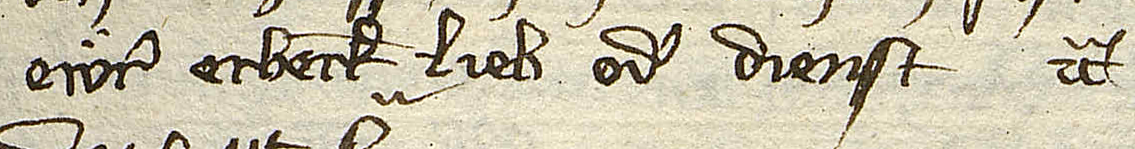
ewr* erberk* lieb od* dienſt ec*
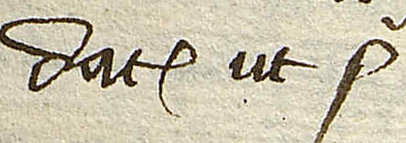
Dat* ut ſ*
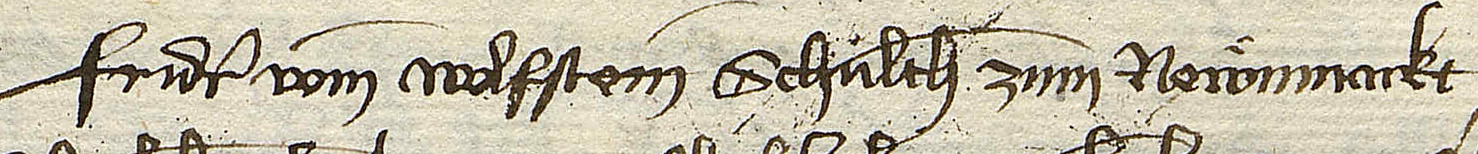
fridr* von wolfſtein Schulth* ʒum Newnmarkt
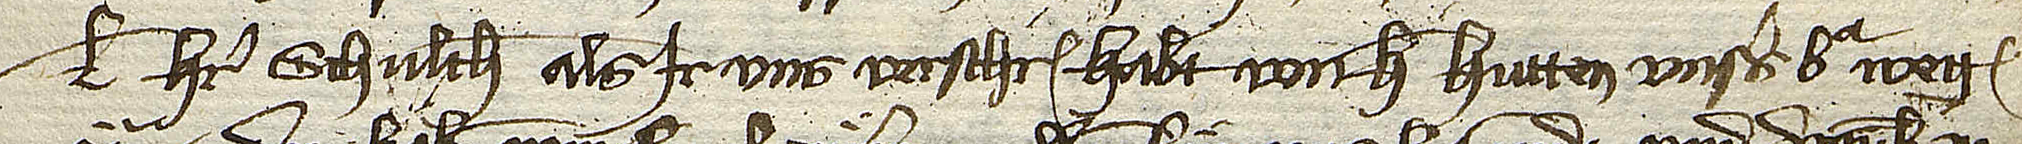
L* hr* Schulth* als Ir vns verſchr* habt von h* hutten vnſ*s b* weg*
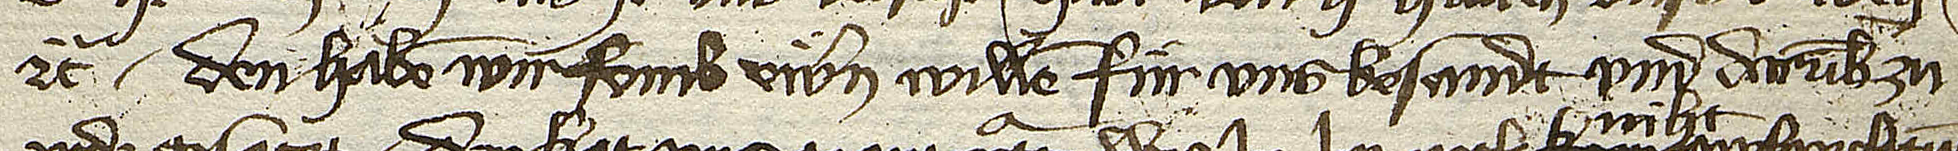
ec* / den habe* wir fvmb ewn* wille* für vns beſandt vnd darub* ʒu
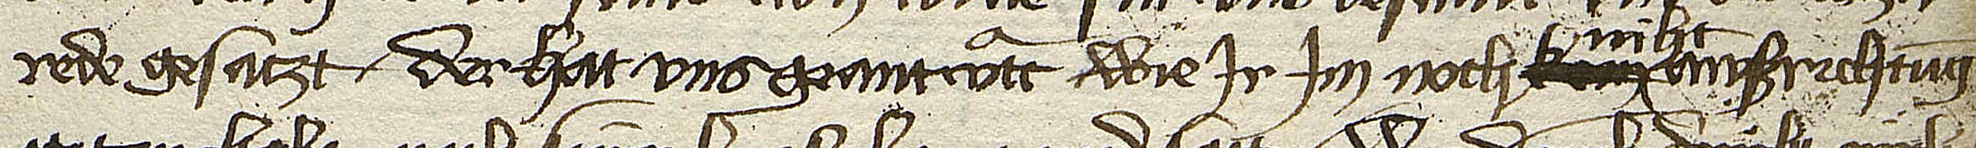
rede geſacʒt / der hat vns geantw*rt / wie Ir Im noch kein awſʒrichtug*
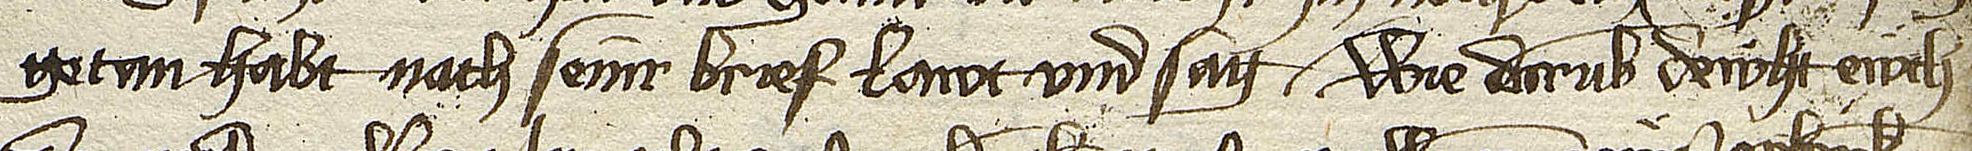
getan habt nach ſeinr brief lawt vnd ſag / wie darub* dewht ewch
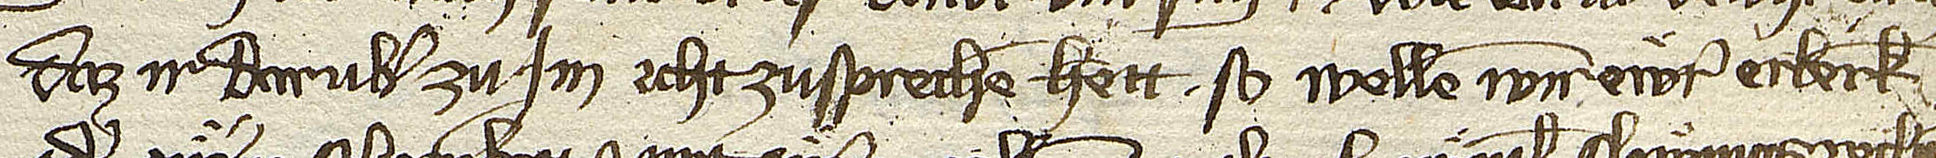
daʒ ir darub* ʒu Im icht ʒuſpreche* hett . ſo welle* wir ewr* erberk*
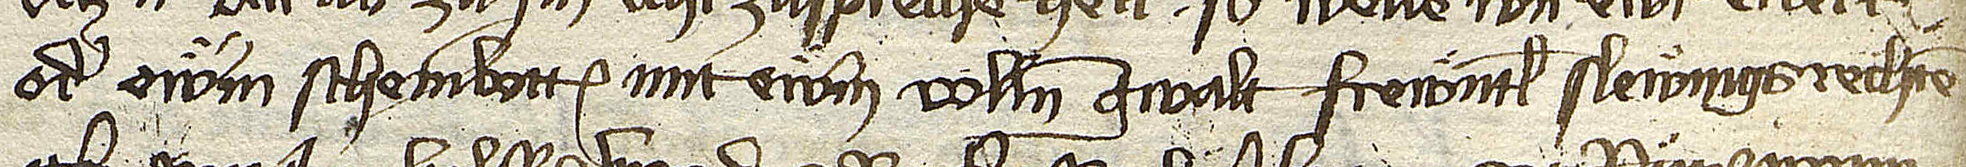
od* ewn* ſcheinbott* mit ewm* voll*n gwalt frewntl* ſlewnigs rechte*
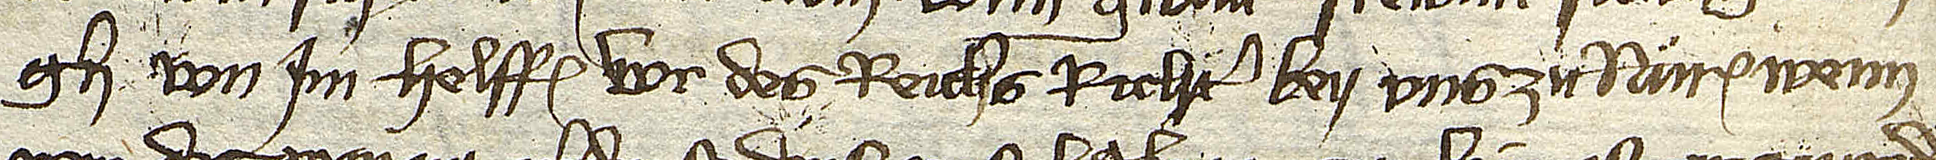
g*n von Im helff* vor des Reichs Richt* bey vns ʒu Nür* wenn
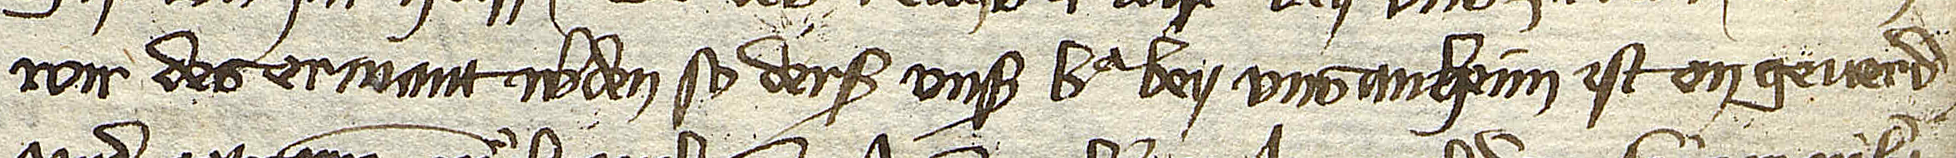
wir des ermant w*den ſo derſ* vnſ* B* bey vns anheim iſt on geuerd
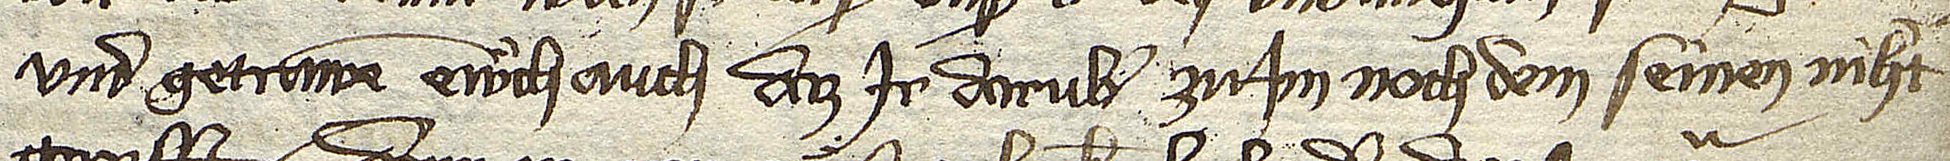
vnd getrawe* ewch auch daʒ Ir darub* ʒu Im noch dem ſeinen niht
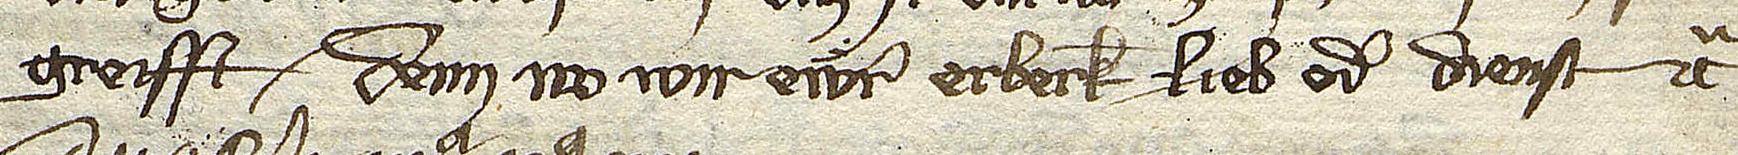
greifft / Denn wo wir ewr* erberk* lieb od* dienſt ec*
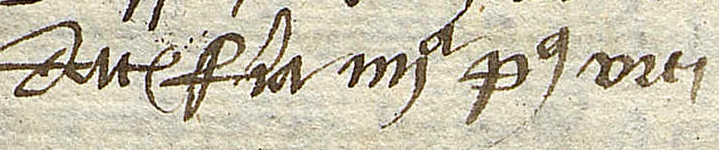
Dat* fia* iiii* P* viti
